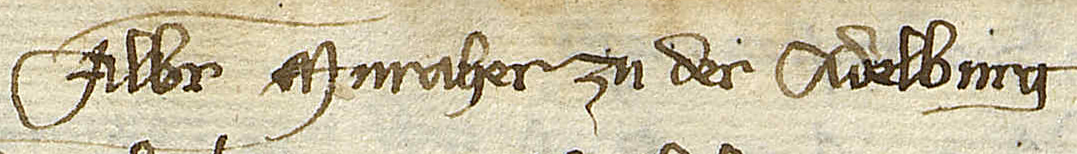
Albr* Muraher ʒu der Adelburg
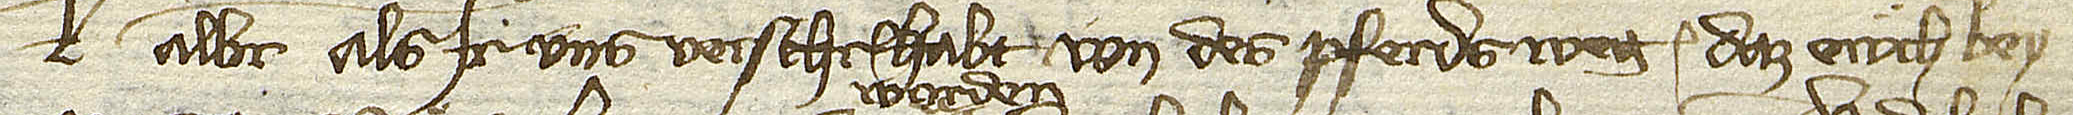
L* albr* als Ir vns verſchr* habt von des pferds weg* daʒ ewch bey
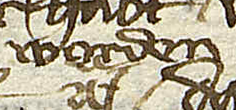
worden
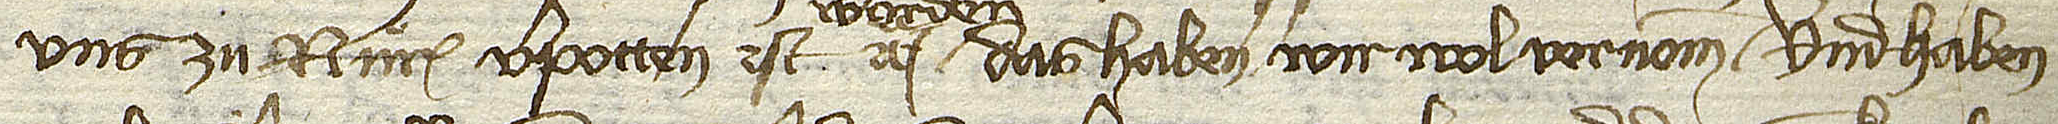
vns ʒu Nür* v*potten iſt ec* / das haben wir wol vernom* / Vnd haben
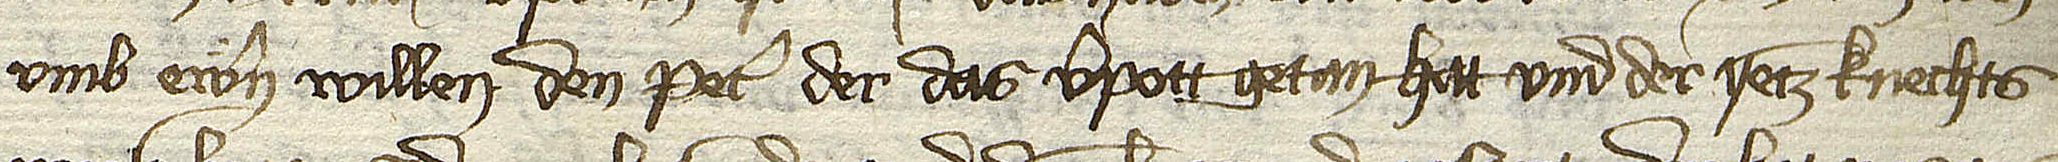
vmb ew*n willen den Pet* der das v*pott getan hat vnd der yecʒ* knechts
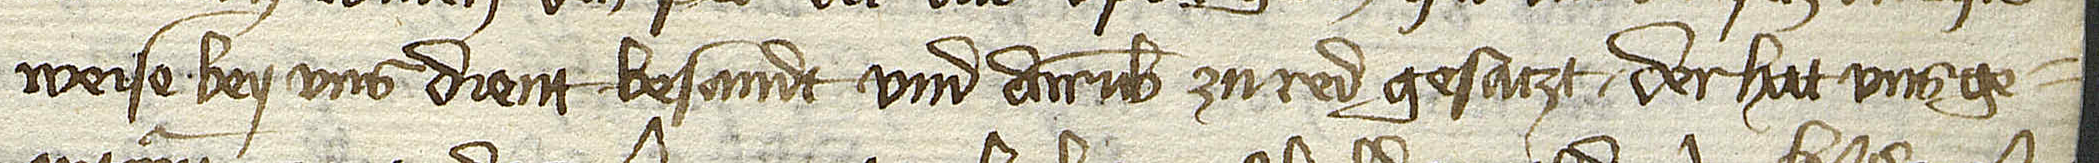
weiſe . bey vns dient beſandt vnd daru*b ʒu red geſacʒt / der hat vns ge =
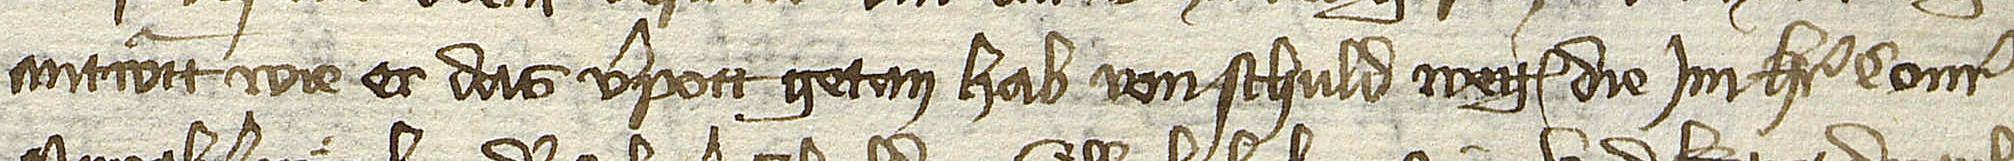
antw*tt wie er das v*pott getan hab von ſchuld weg* die Im H*r Conr*
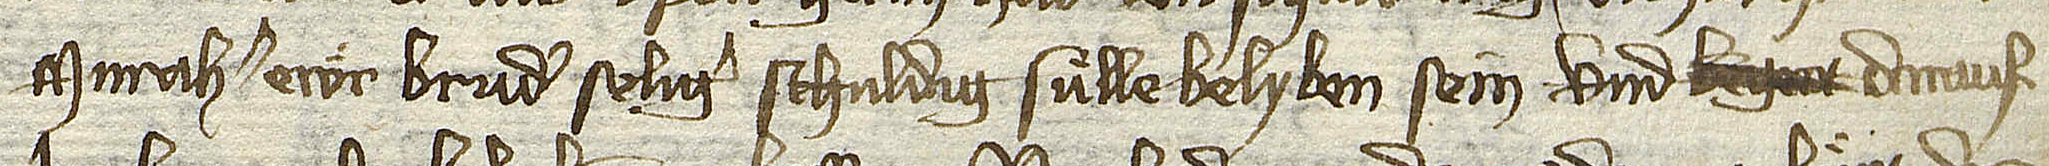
Murah* ewr brud* ſelig* ſchuldig ſülle belyben ſein Vnd begert darauf
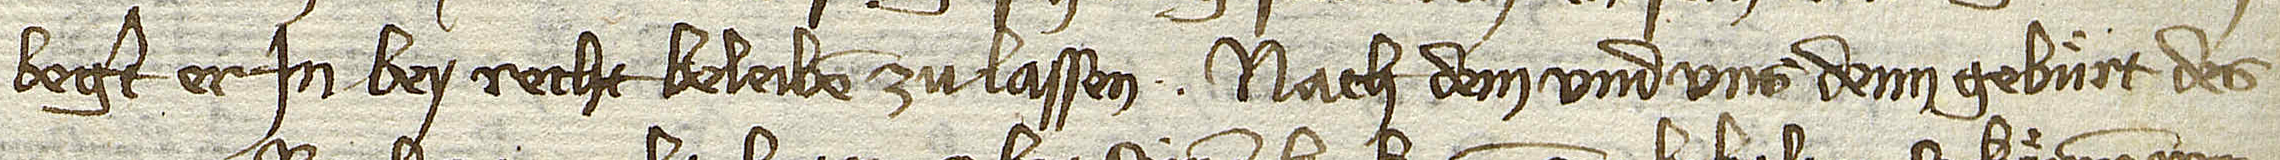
beg*t er In bey recht beleibe* ʒu laſſen . Nach dem vnd vns denn gebürt des
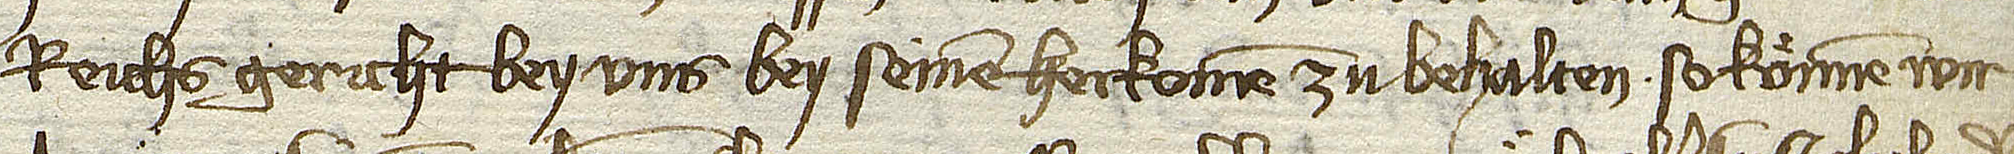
Reichs gericht bey vns bey ſeine* herkome* ʒu behalten . ſo könne* wir
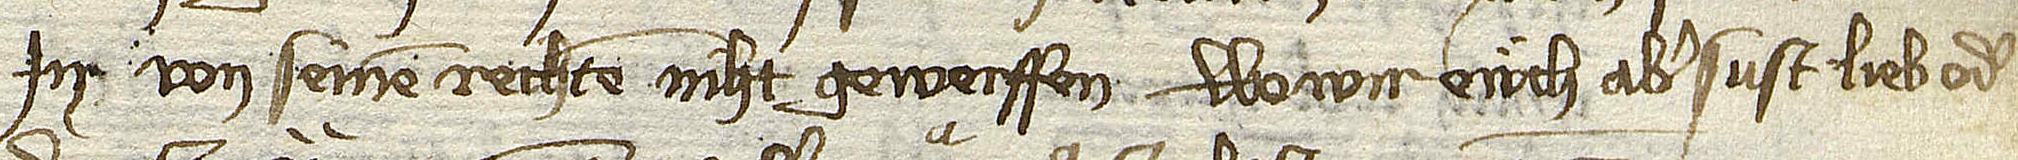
In von ſeine* rechte* niht gewerffen . Wo wir ewch ab* ſuſt lieb od*
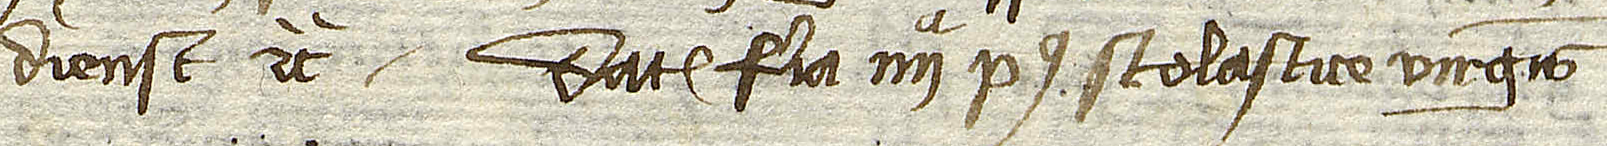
dienſt ec* / Dat* fia* iiii* p* ſtolaſtice virgi*is
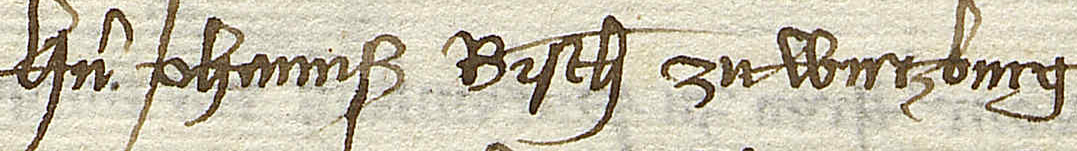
H*n Iohannſ* Biſch* ʒu Wircʒburg
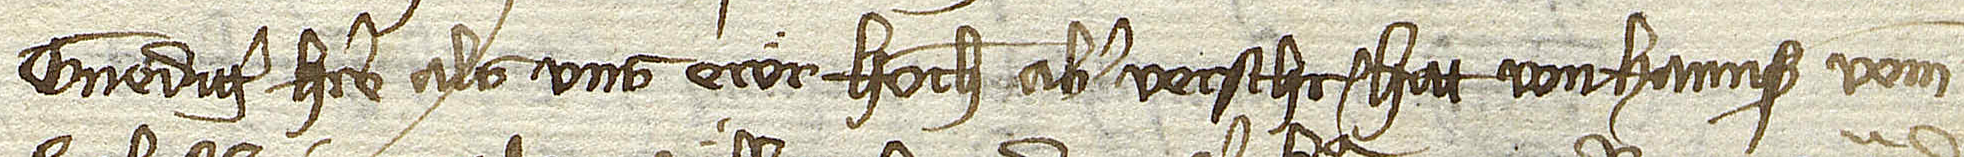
Gnedig* h*re als vns ewr hoch* ab* verſchr* hat von hannſ* vom*
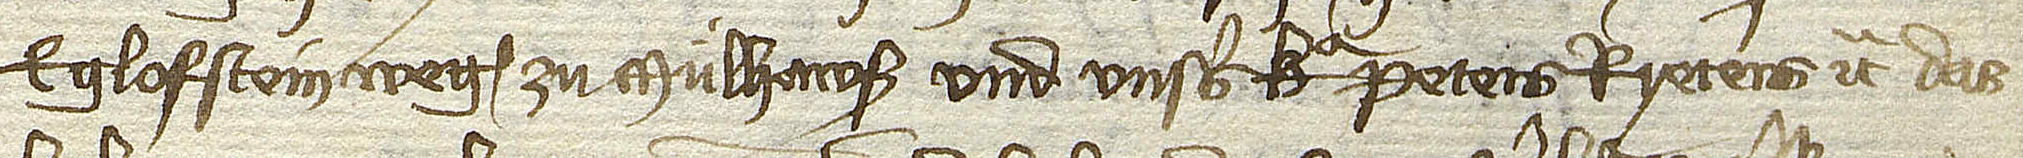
Eglofſtein weg* ʒu Mülhawſ* vnd vnſ*s b* Peters Ryeters ec* das
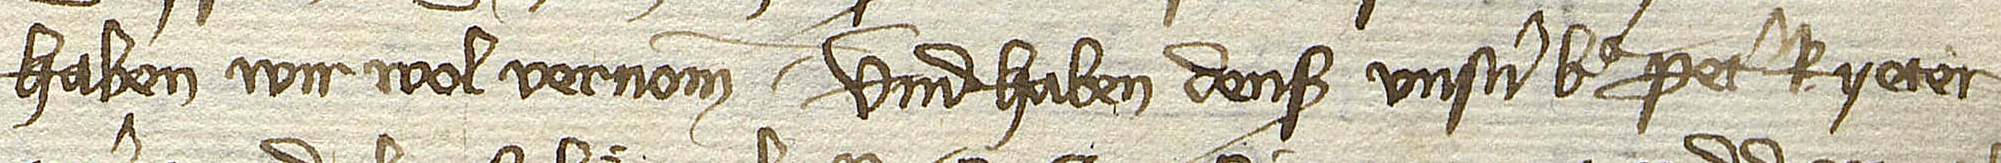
haben wir wol vernom* / Vnd haben denſ* vnſ*n b* Pet* Ryeter
